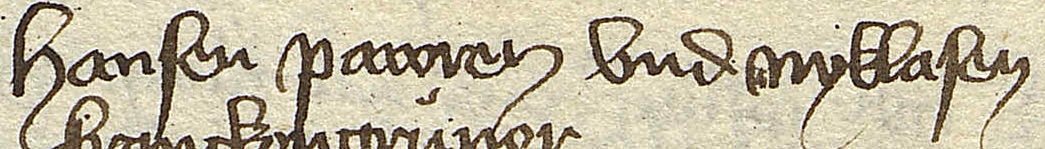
hanſen pawren vnd Nyklaſen
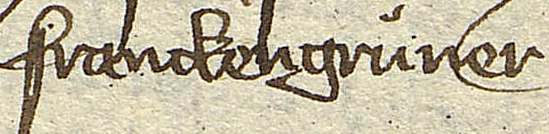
franckengrüner
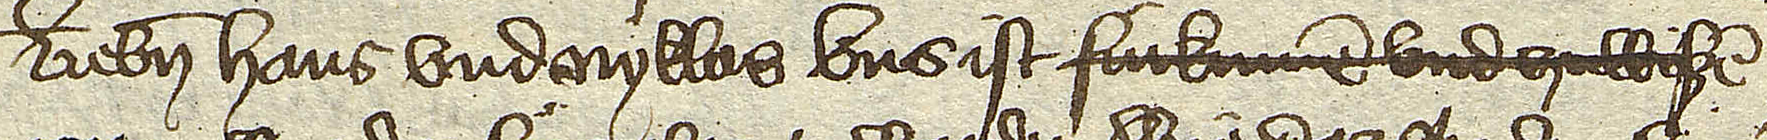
Liebn* hans vnd Nyklas vns iſt fürkume* vnd cʒewiſʒe*
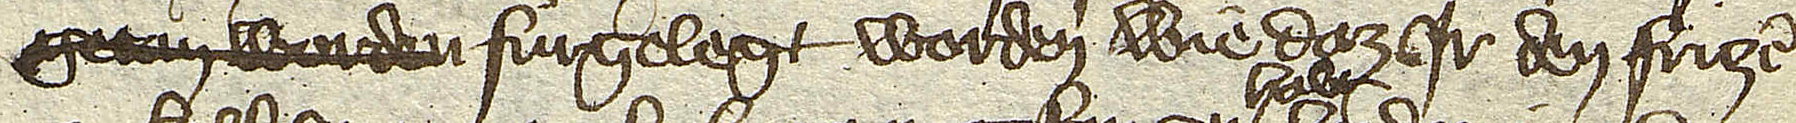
getan worden fürgelegt worden / wie daʒ Ir den fricʒe*
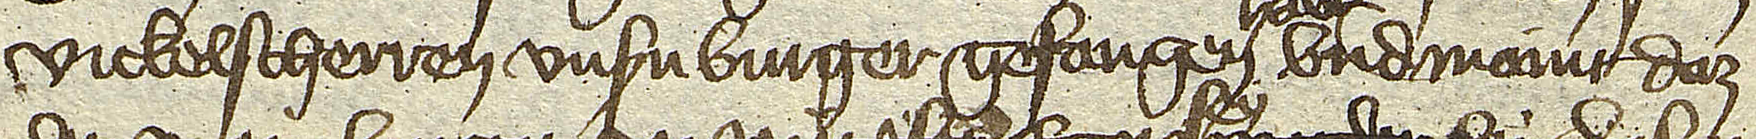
vickelſcherren vnſ*n burger gefangen vnd maint / daʒ
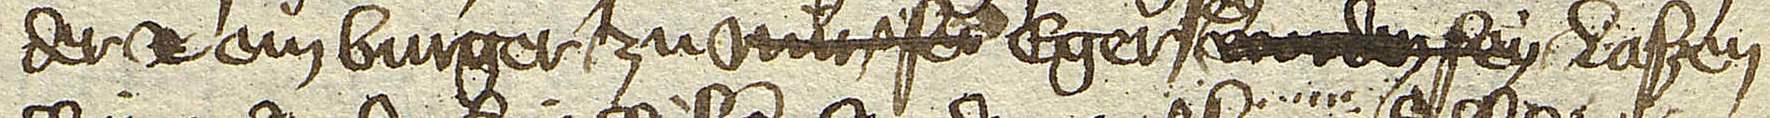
der % ein burger cʒu Nür* ſei Eger worden ſey / laſʒen
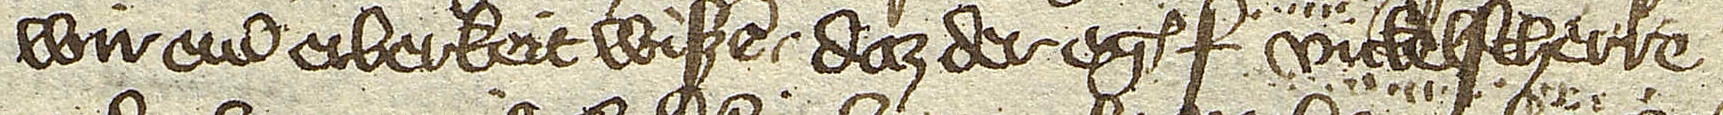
wir ew* erberkeit wiſʒe* / daʒ der eg* F vickelſcherre
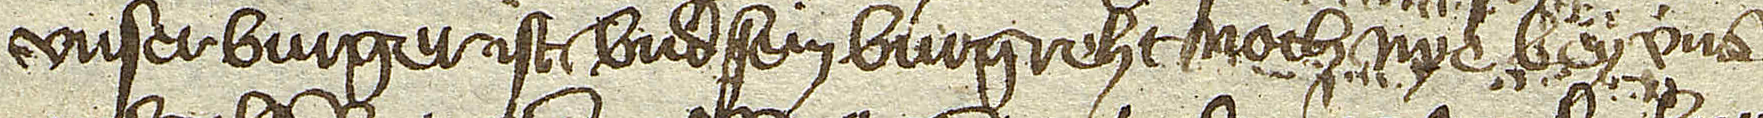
vnſer burger iſt / vnd ſein burgreht noch nye bey vns
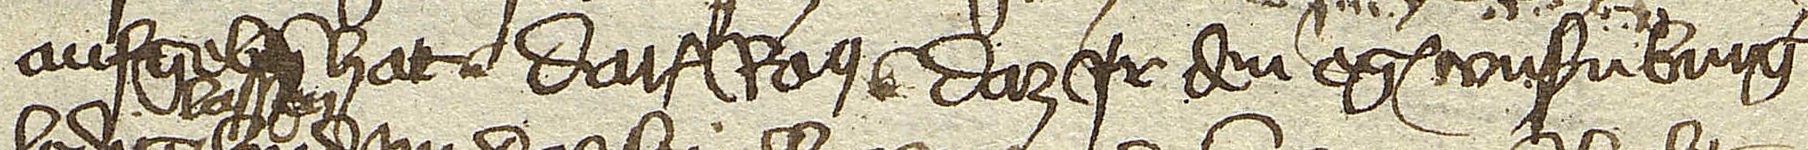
aufgebn* hat / Dar* Ro* / Daʒ Ir den eg* vnſ*n burg*
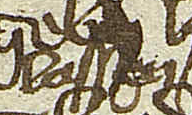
laſſen
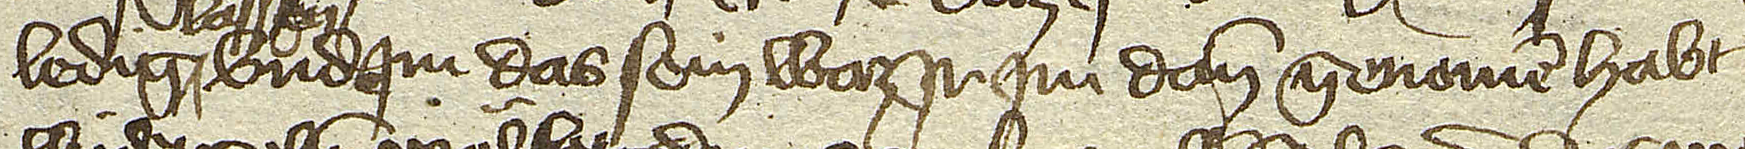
ledig vnd Im das ſein waʒ Ir Im dan* genome* habt
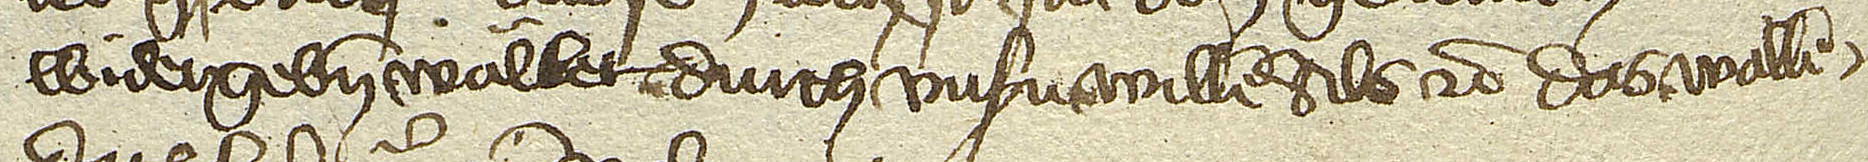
widergebn* wöllet / durch vnſ*n wille* Als ec* das wolle* /
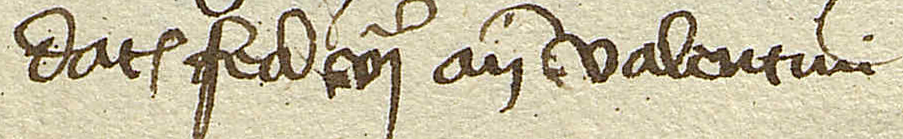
Dat* fea* vi* an* valentini
